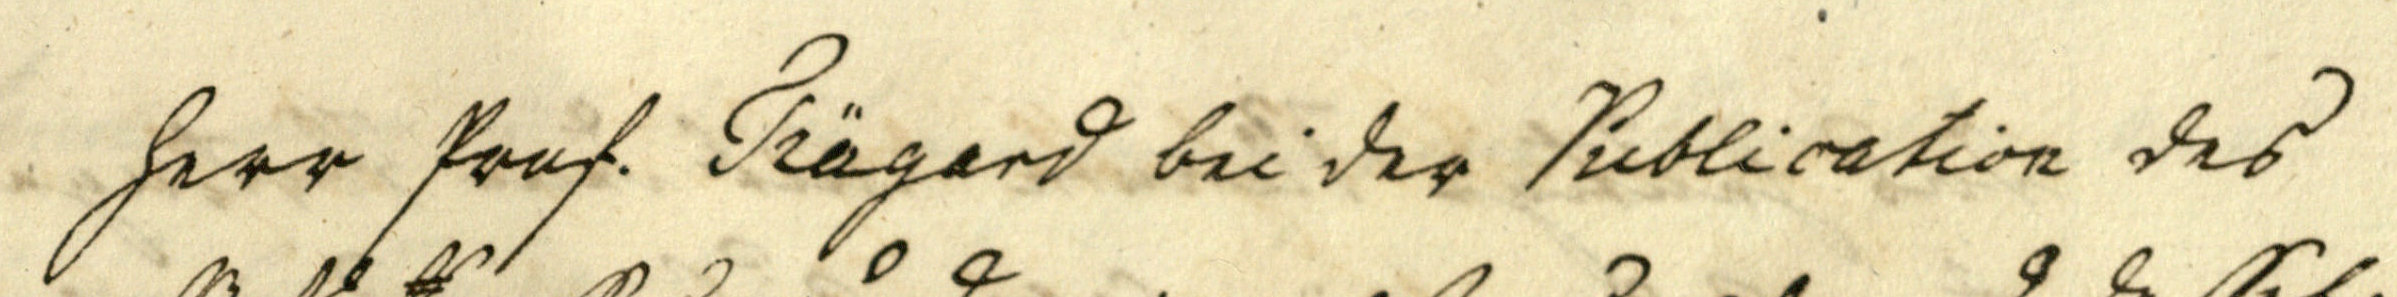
Herr Prof. Trägård bei der Publication des
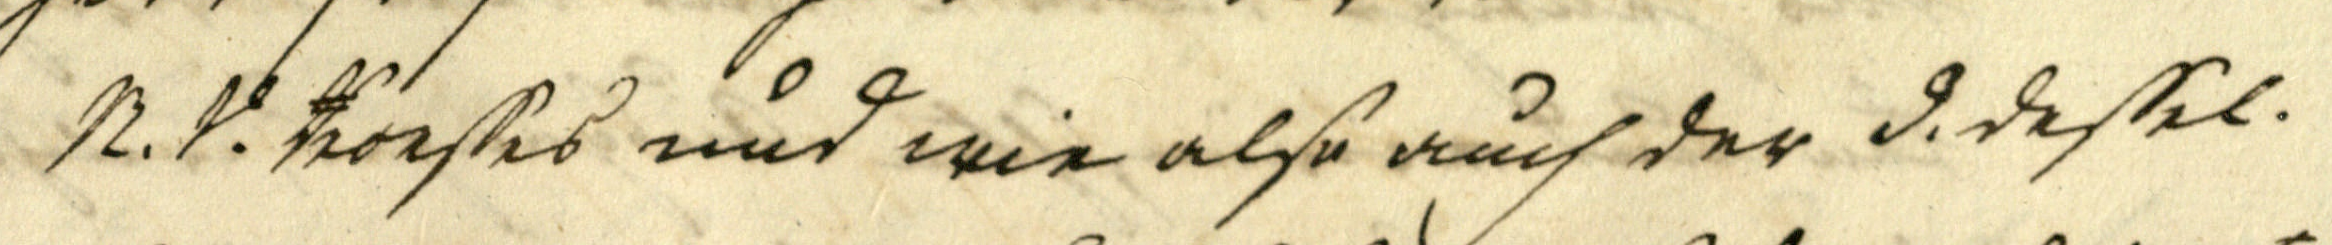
N. V. Recesses und wie also auch der §. dessel¬
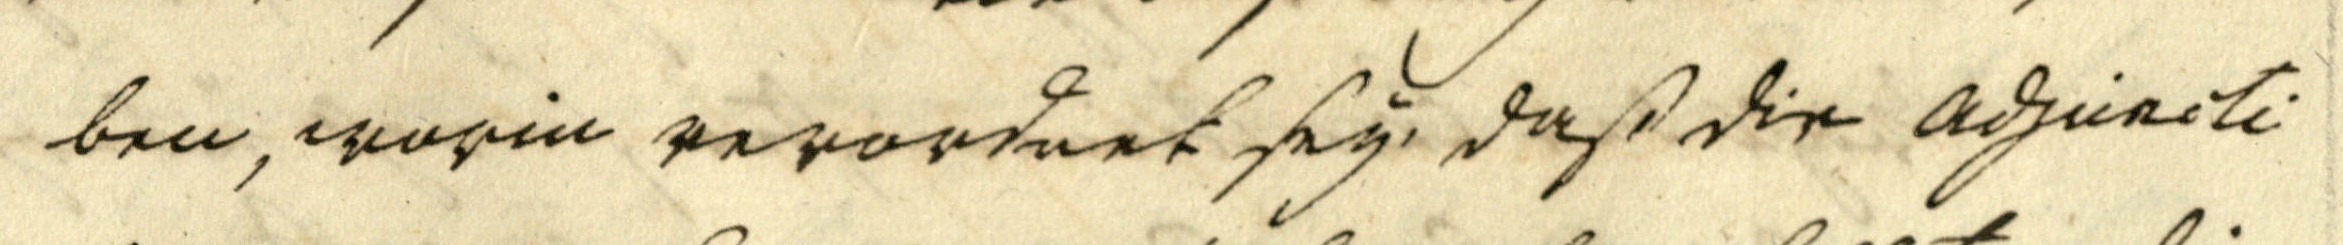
ben, worin verordnet seÿ, daß die Adjuncti
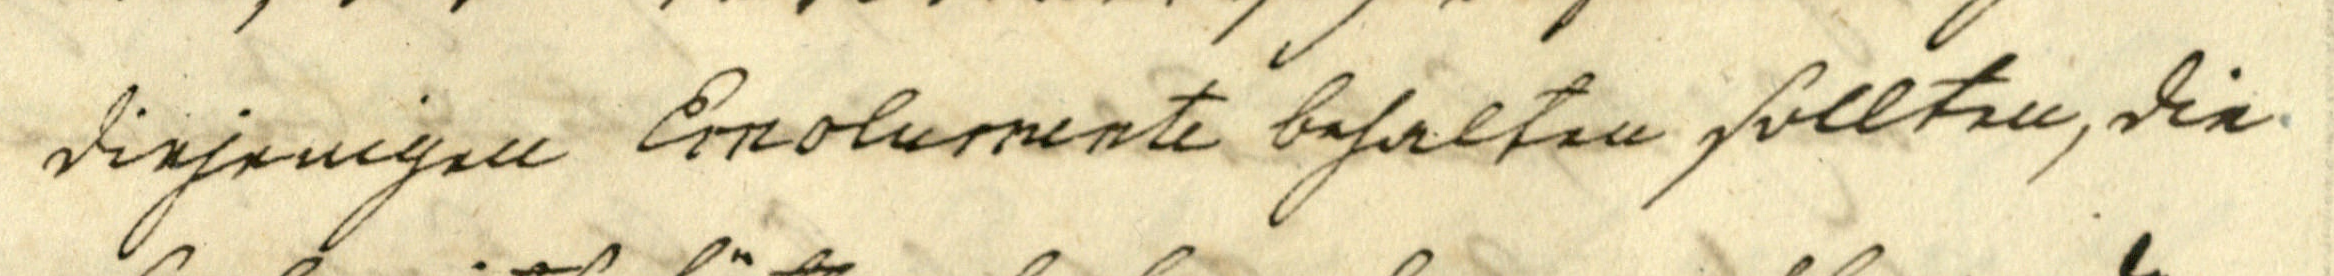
diejenigen Emolumente behalten sollten, die
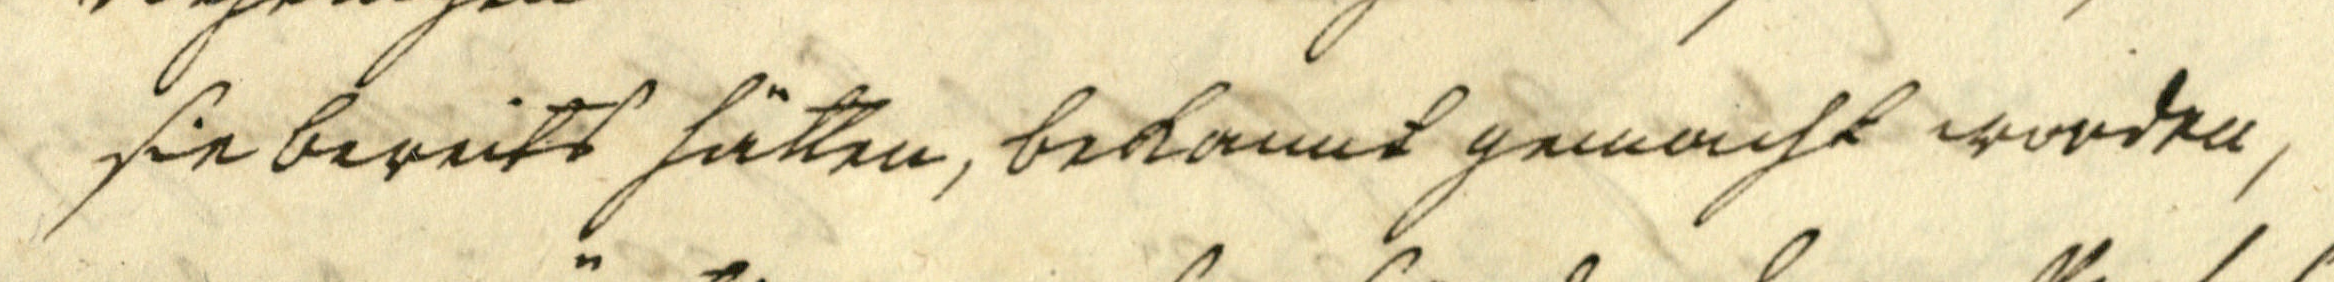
sie bereits hätten, bekannt gemacht worden,
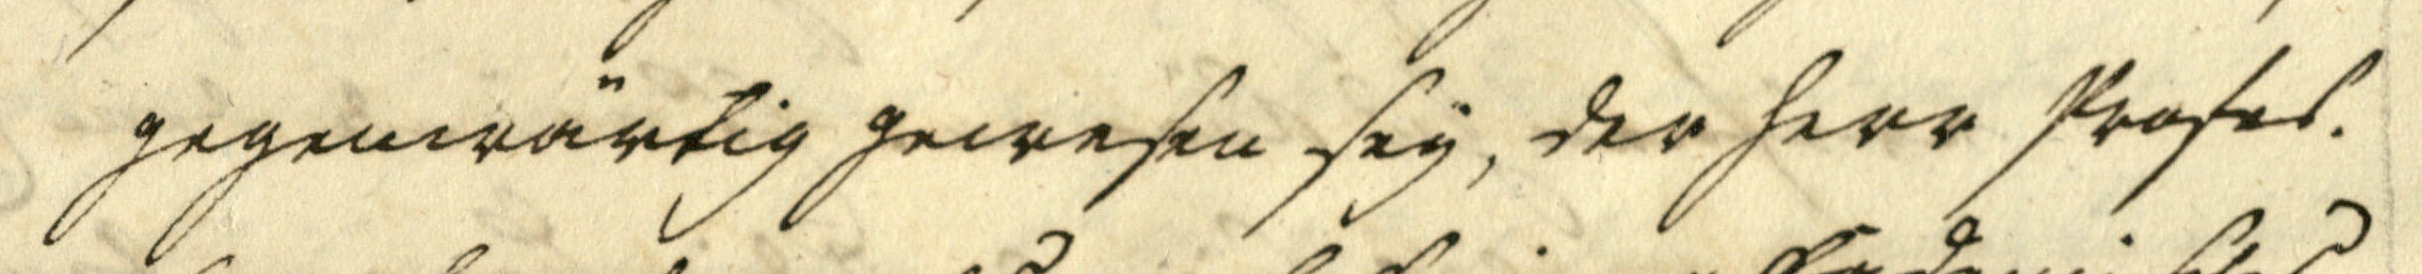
gegenwärtig gewesen seÿ, der Herr Profes¬
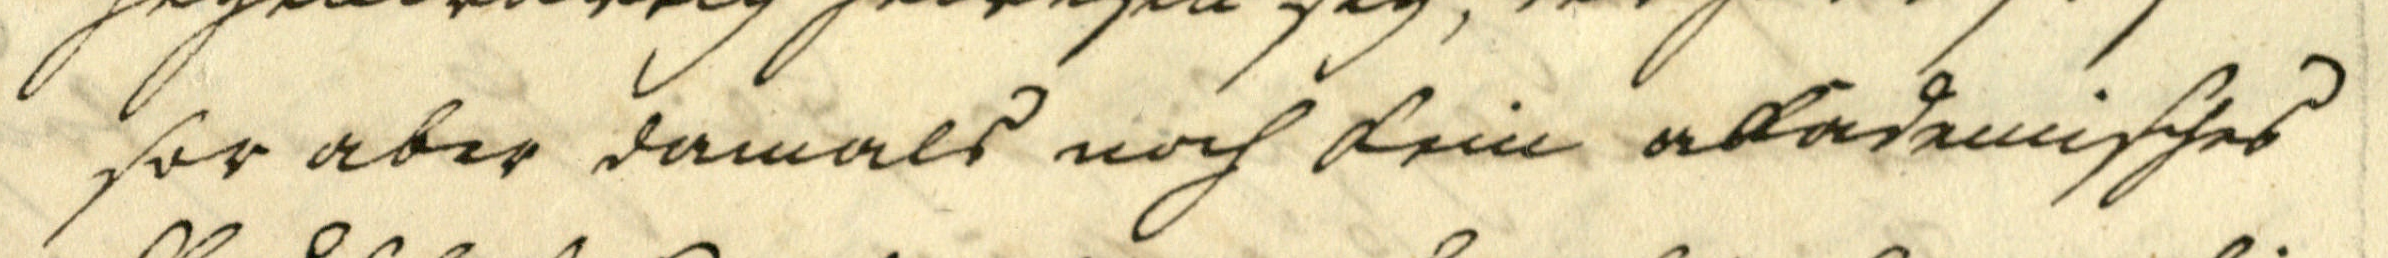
sor aber damals noch kein akademisches
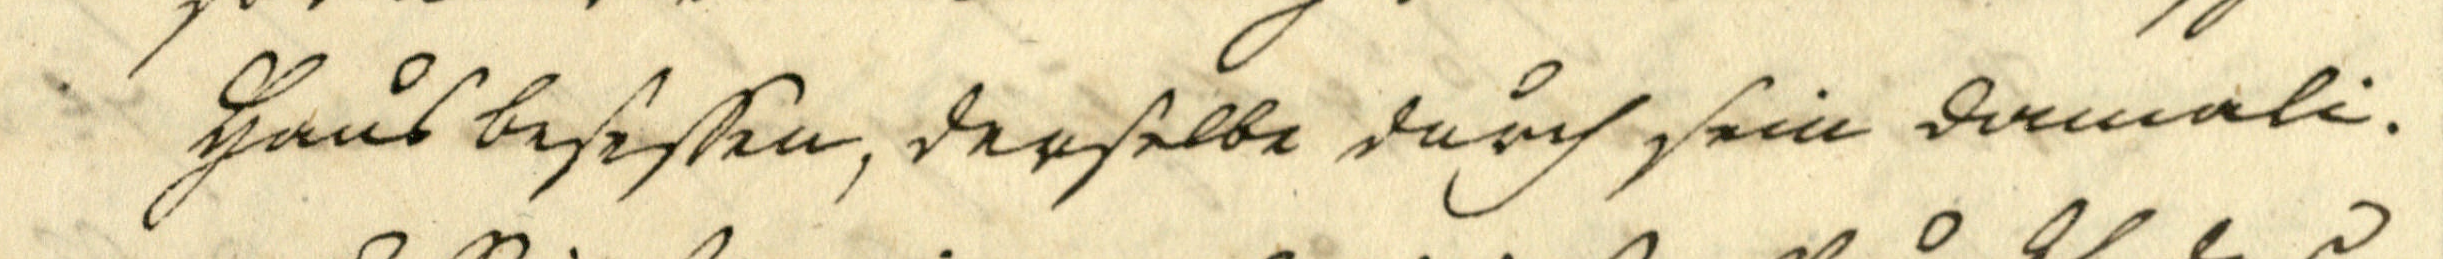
Haus besessen, derselbe durch sein damali¬
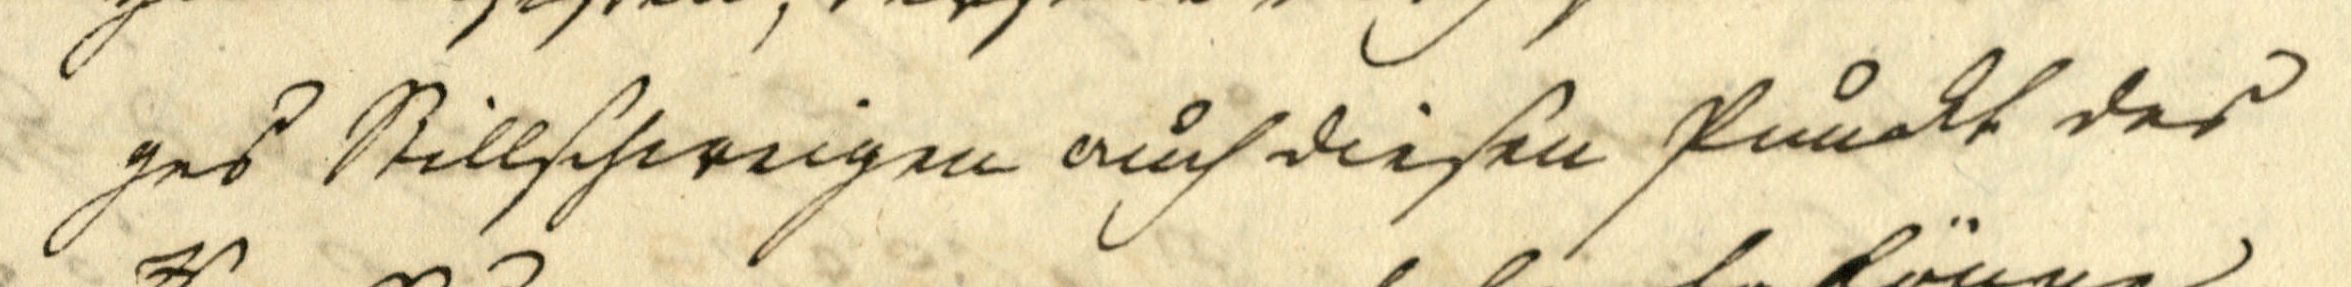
es Stillschweigen auch diesen Punckt der
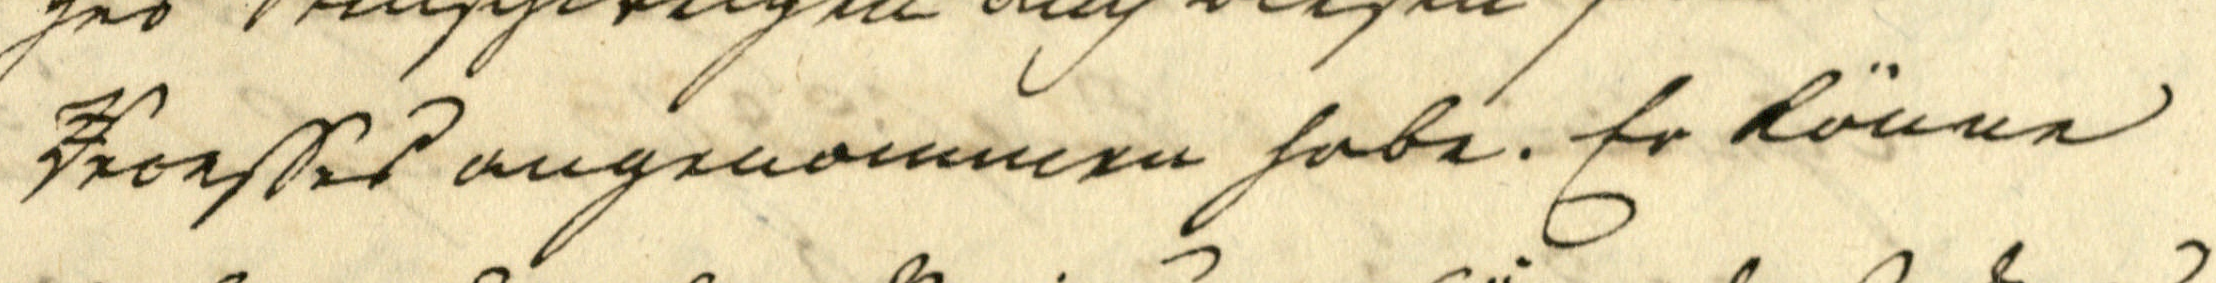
Recesses angenommen habe. Er könne
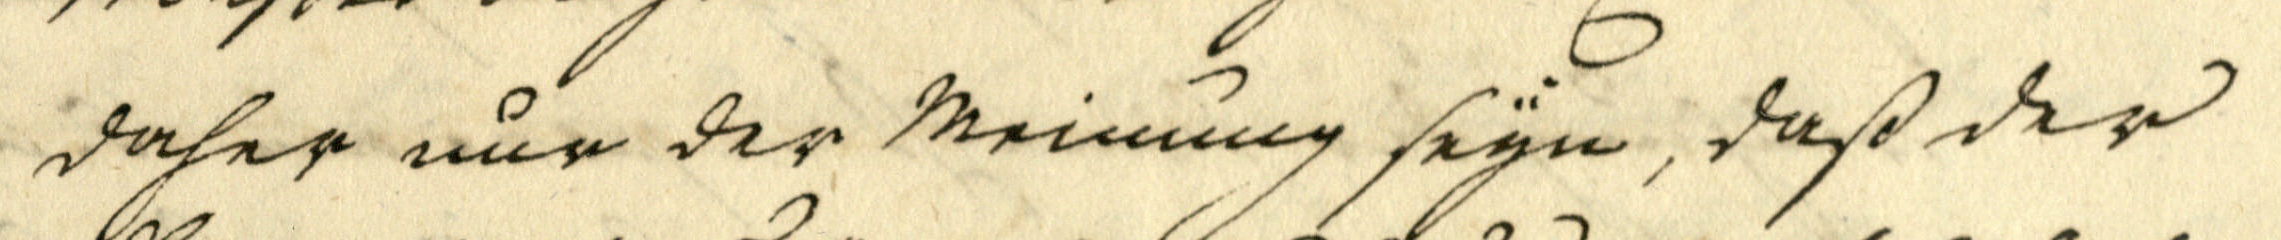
daher nur der Meinung seÿn, daß der
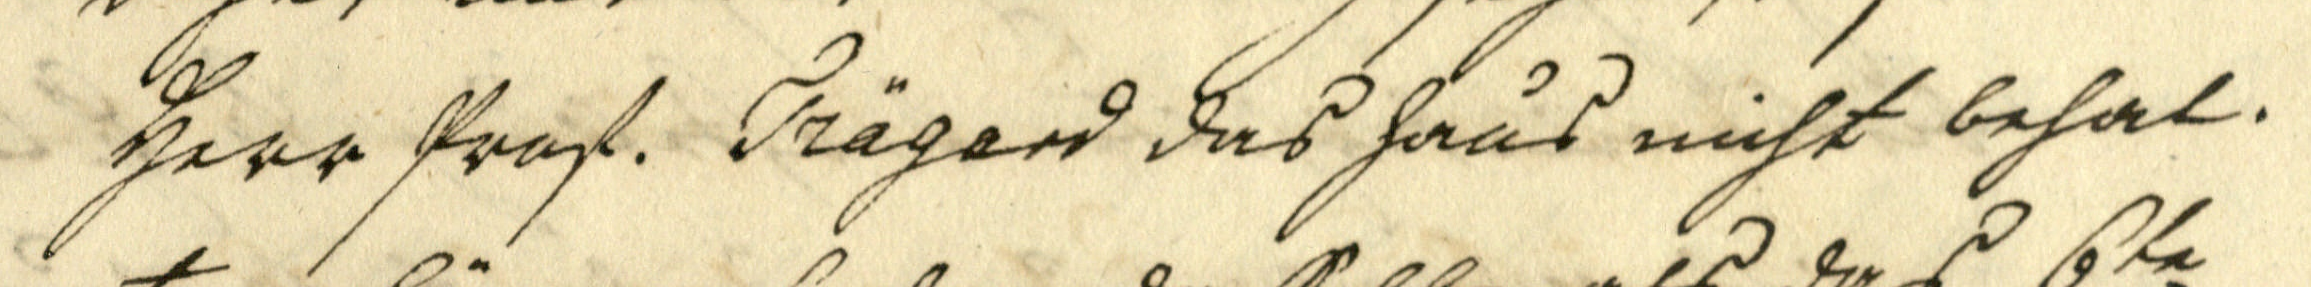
Herr Prof. Trägård das Haus nicht behal¬
